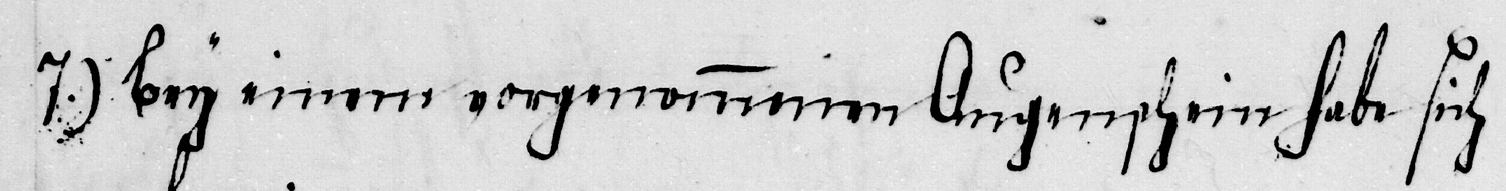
7.) Bey einem vorgenommenen Augenschein habe sich
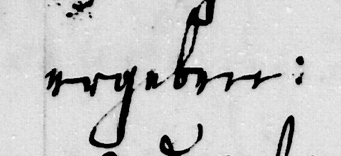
ergeben:
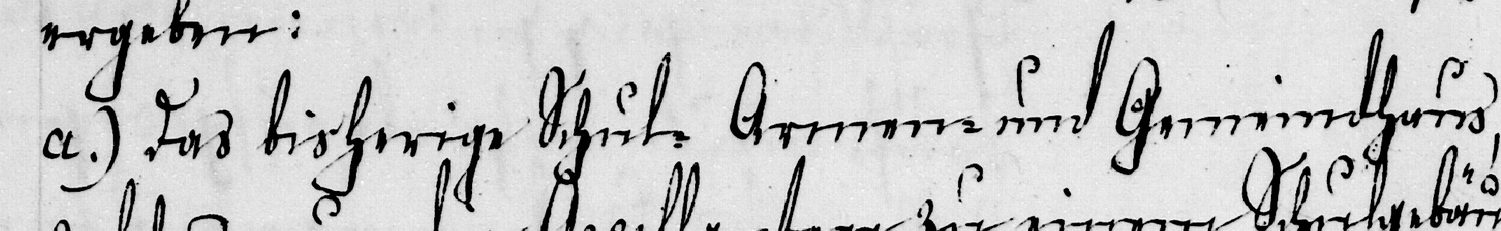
a.) Das bisherige Schul-[,] Armen- und Gemeindhau¬
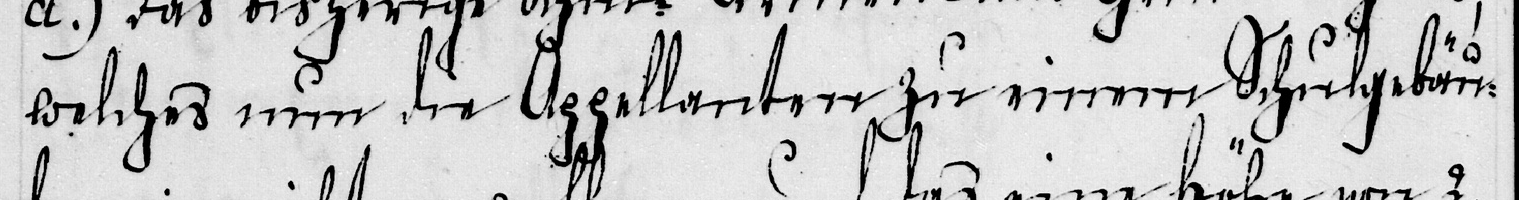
welches nun die Appellanten zu einem Schulgebäu¬
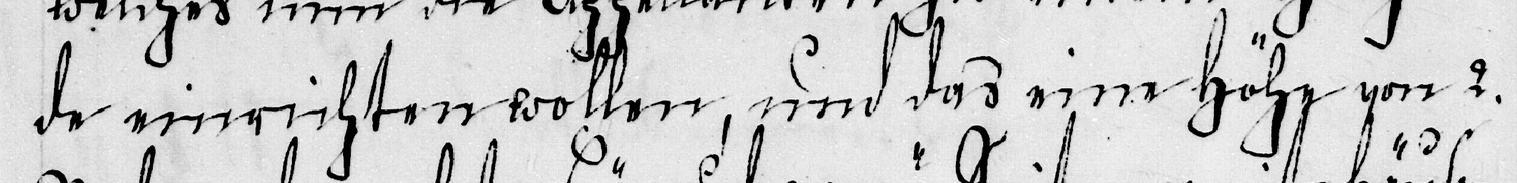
de einrichten wollen, und das eine Höhe von 2.
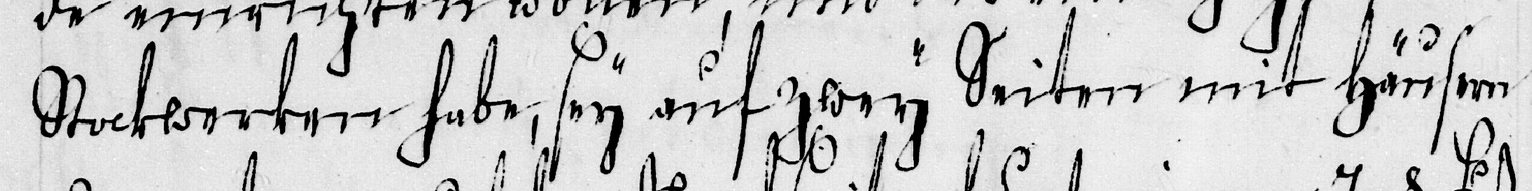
Stockwerken habe, sey auf zwey Seiten mit Häusern
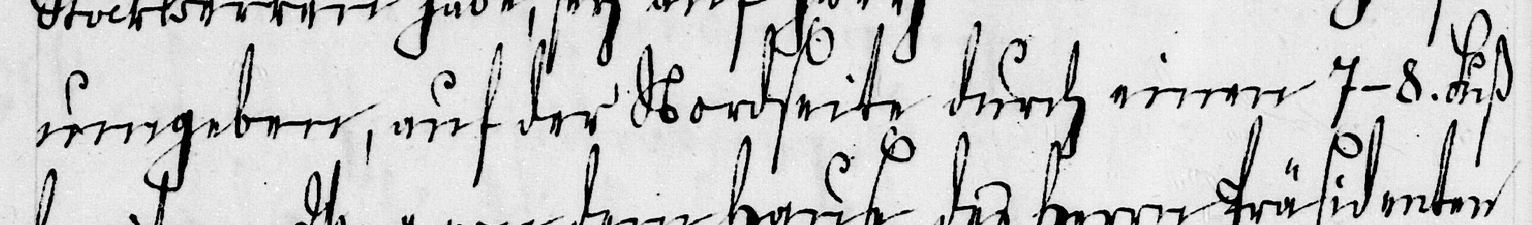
umgeben, auf der Nordseite durch einen 7–8. Fuß
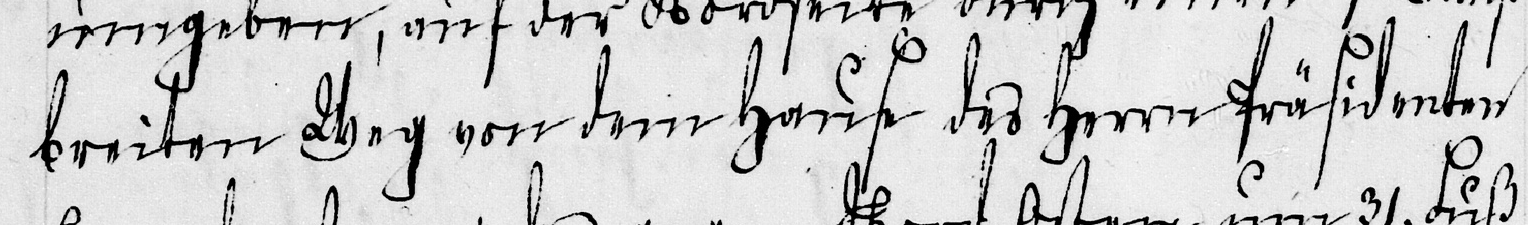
breiten Weg von dem Hause des Herrn Präsidenten
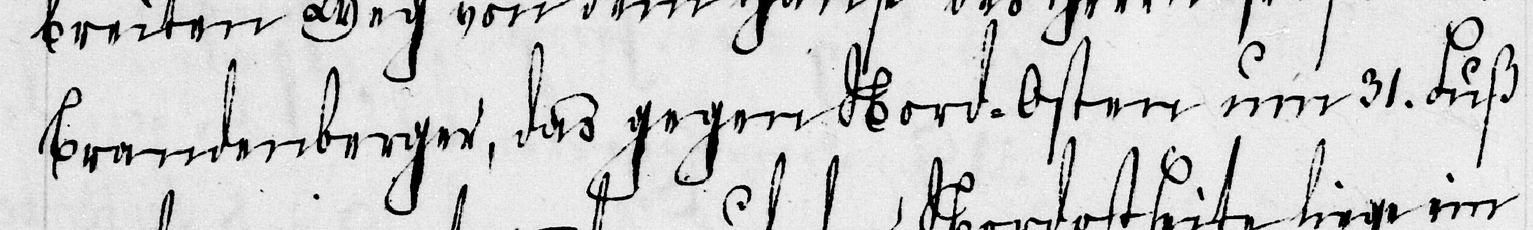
Brandenberger, das gegen Nord-Osten um 31. Fuß
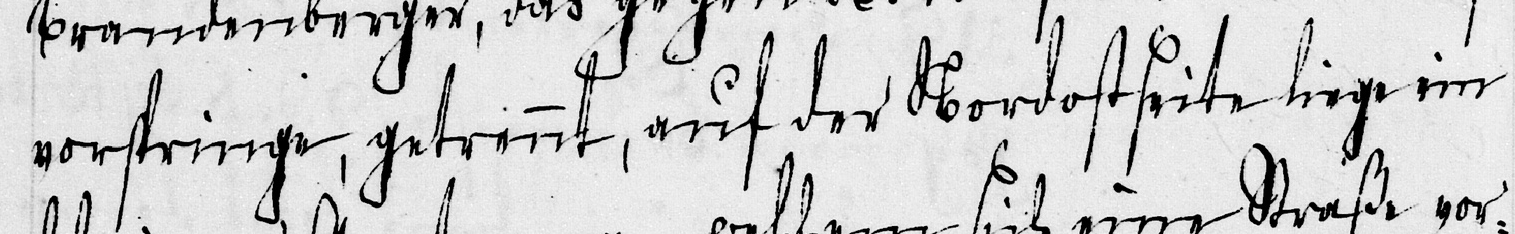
vorspringe, getrennt, auf der Nordostseite liege ein
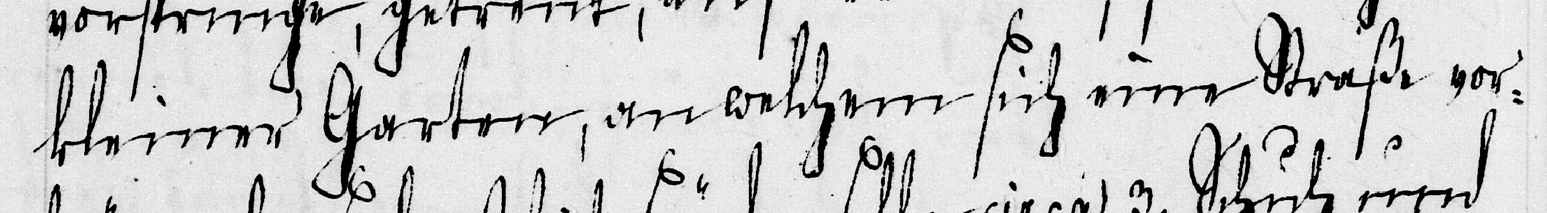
kleiner Garten, an welchem sich eine Straße vor¬
